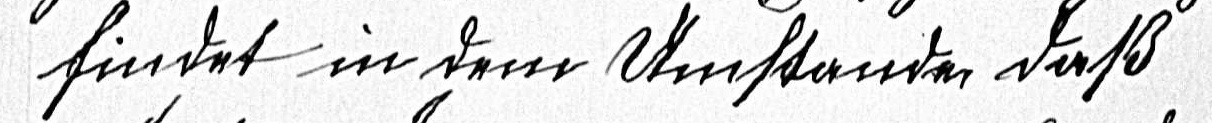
findet in dem Umstande daß
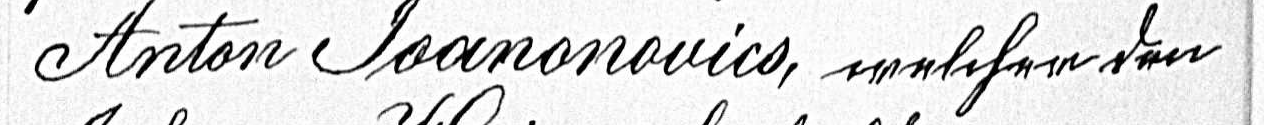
Anton Ioanovics, welcher den
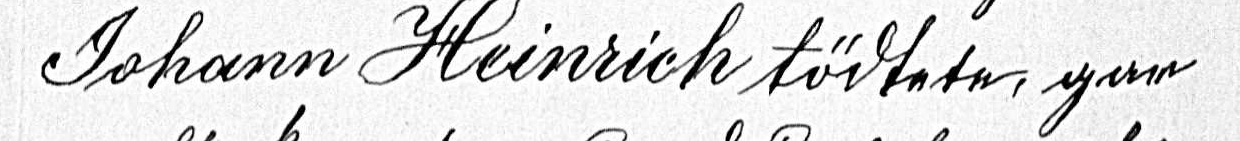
Johann Heinrich tödtete, gar
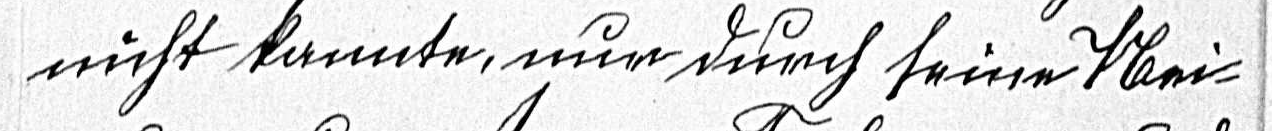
nicht kannte, nur durch seine Nei¬
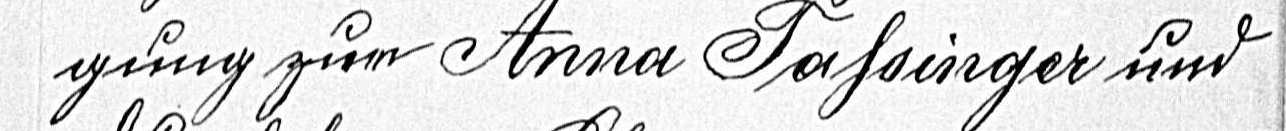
gung zur Anna Tassinger und
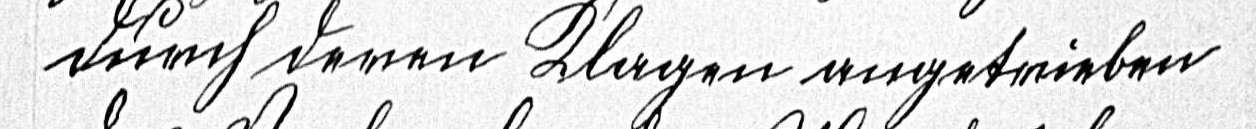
durch deren Klagen angetrieben
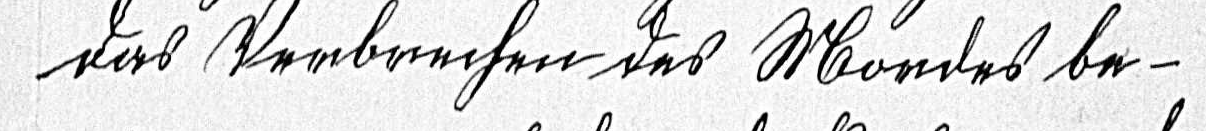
das Verbrechen des Mordes be¬
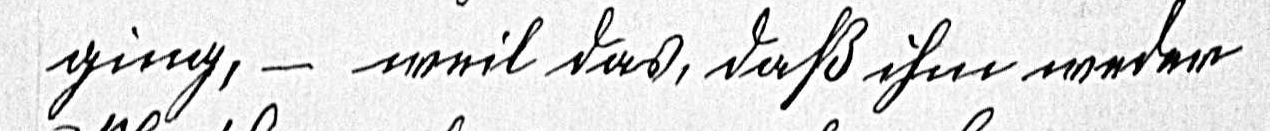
ging, – weil das, daß ihm weder
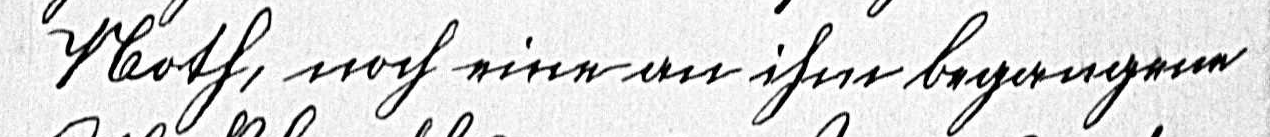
Noth, noch eine an ihm begangene
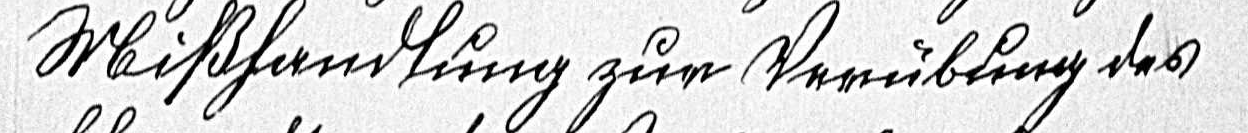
Mißhandlung zur Verübung des
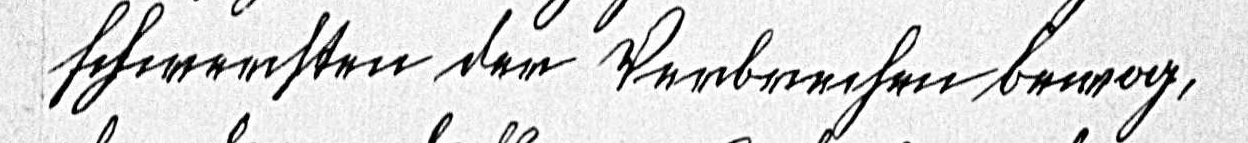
schwersten der Verbrechen bewog,
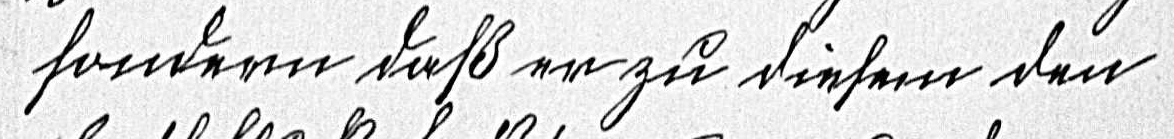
sondern daß er zu diesem den
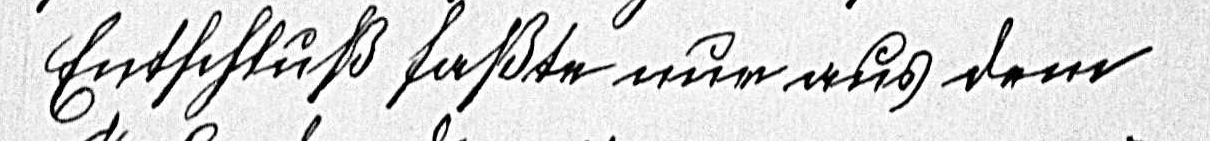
Entschluß faßten nur aus dem
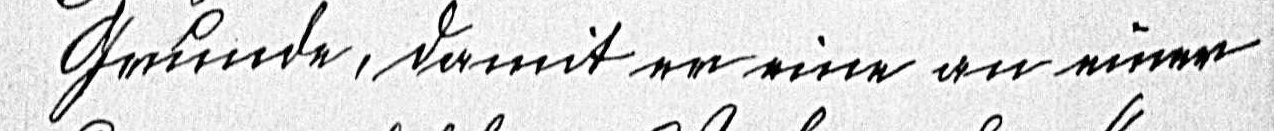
Grunde, damit er eine an einer
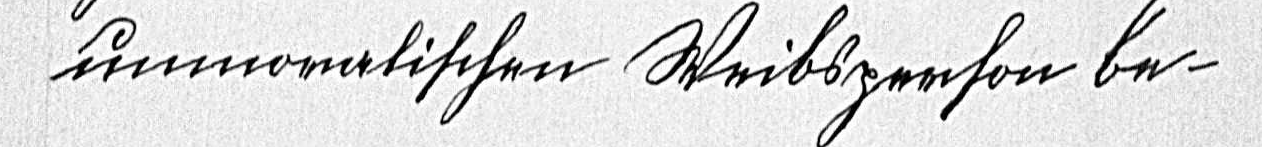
unmoralischen Weibsperson be¬
